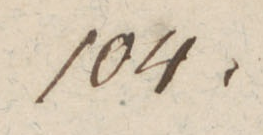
104.
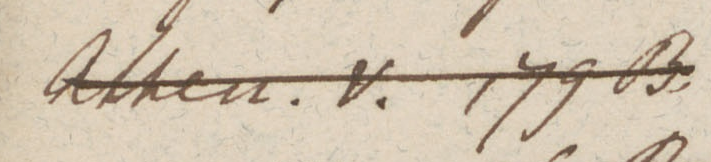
Auch in der Köomödie
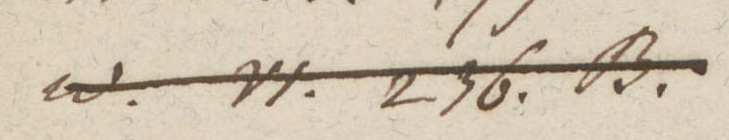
wurde das das die Sitte
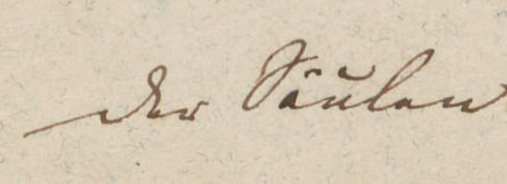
den Säulen
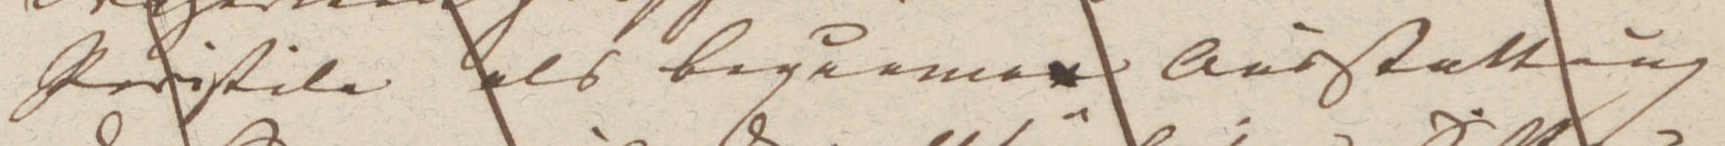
Peristile als bequemer Ausstattung
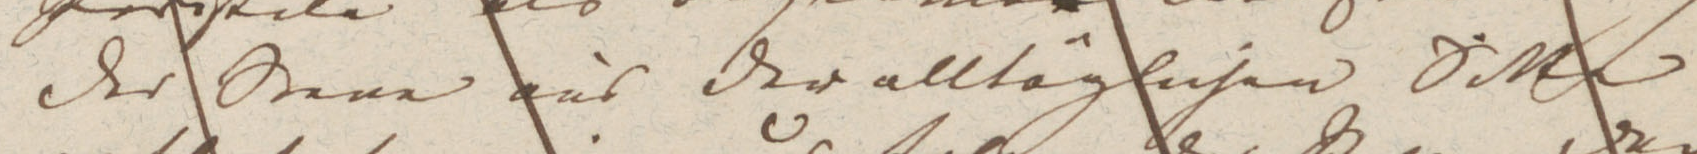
der Scene aus der alltäglichen Sitte
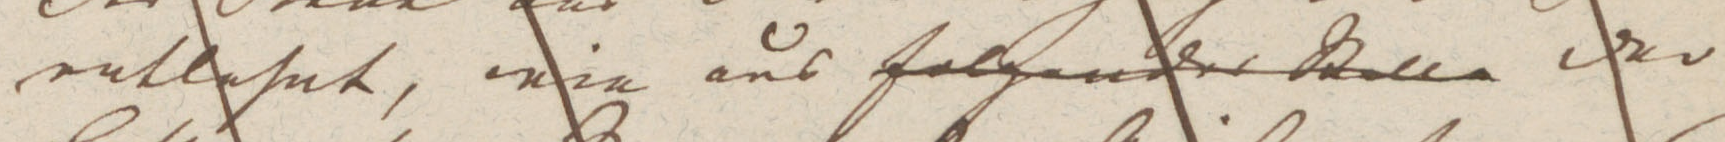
entlehnt, wie aus folgender Stelle der
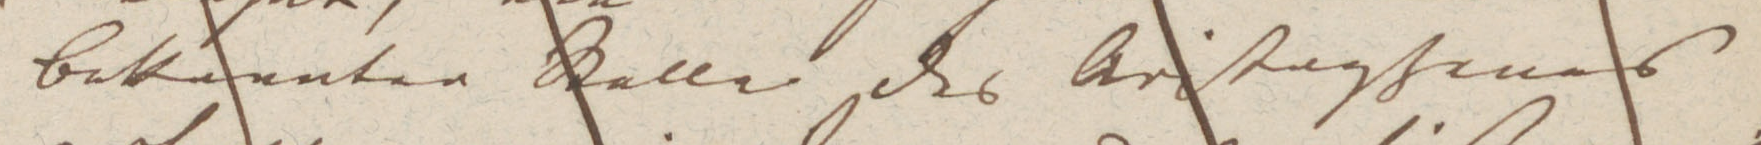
bekannten Stelle des Aristophanes
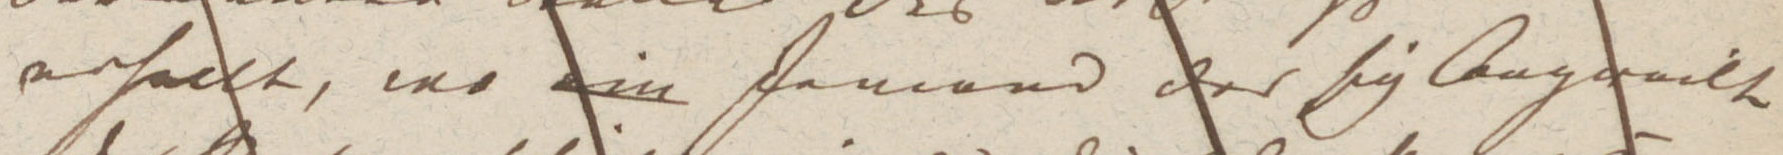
erhellt, wo ein Jemand der sich langweilt
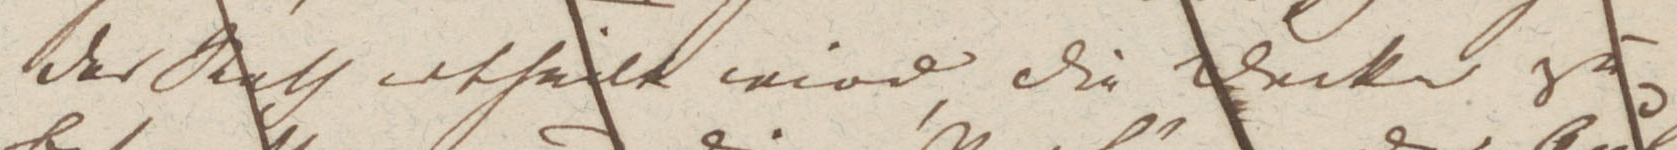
der Rath ertheilt wird, die Decke zu
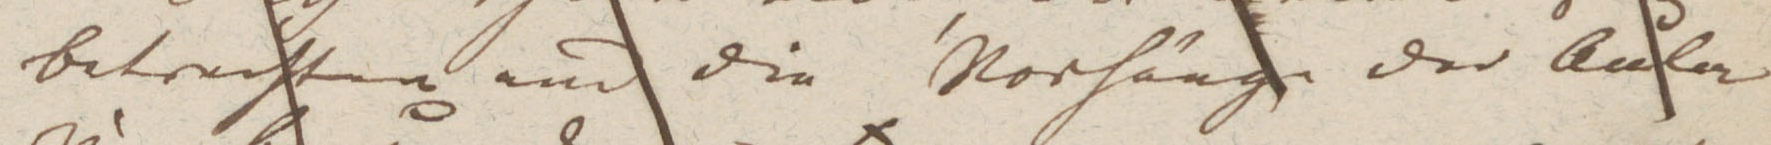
betrachten und die Vorhänge der Aula
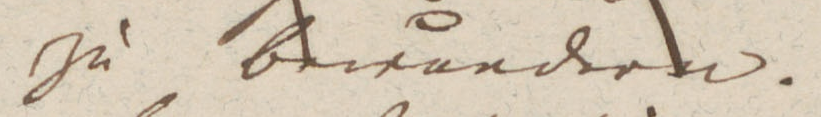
zu bewundern.%
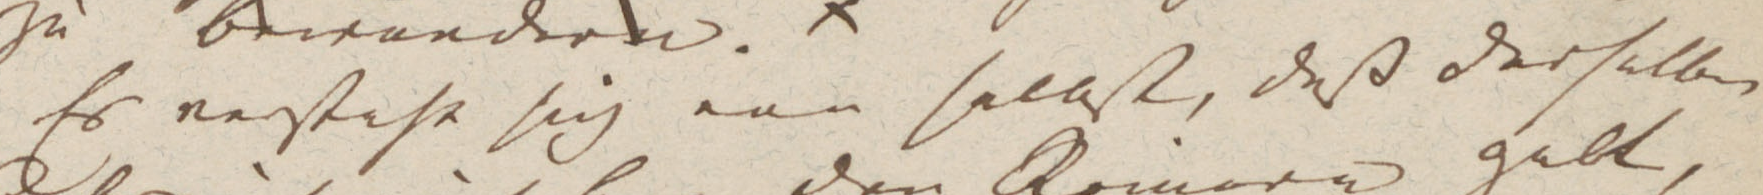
Es versteht sich von selbst, dass derselbe
